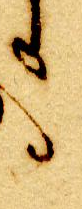To
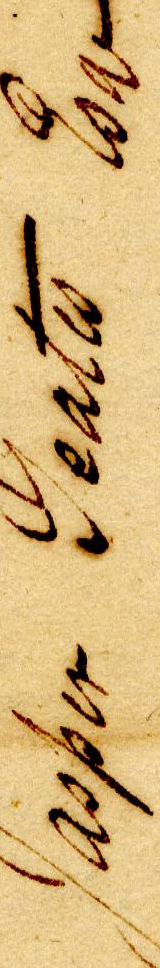Jasper Yeates Esq
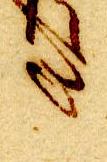at
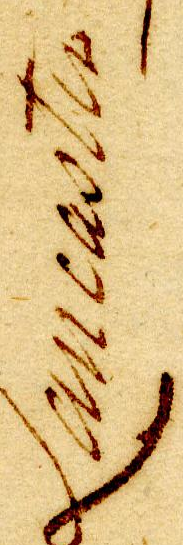Lancaster
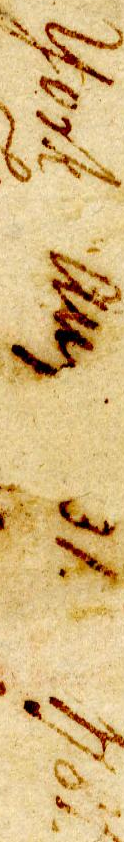York Aug 31^st 1781
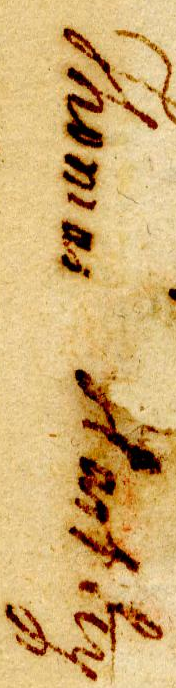Thomas Hartley
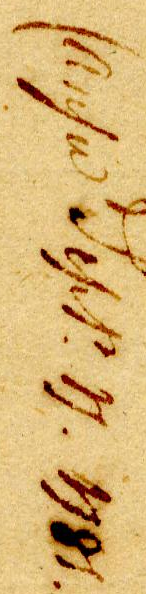(Answ^d Sept^r 17. 1781. )
